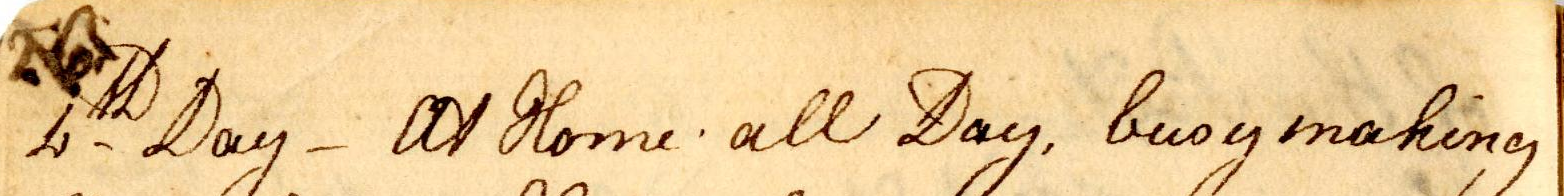4^th Day- At Home all Day, busy making
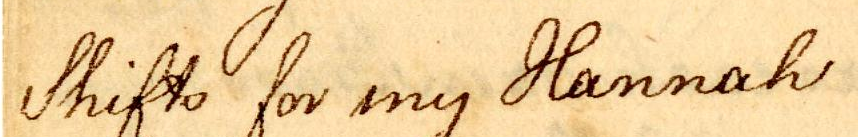Shifts for my Hannah
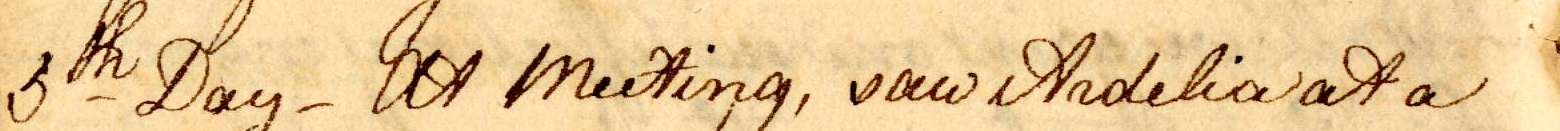5^th Day- At Meeting, saw Ardelia at a
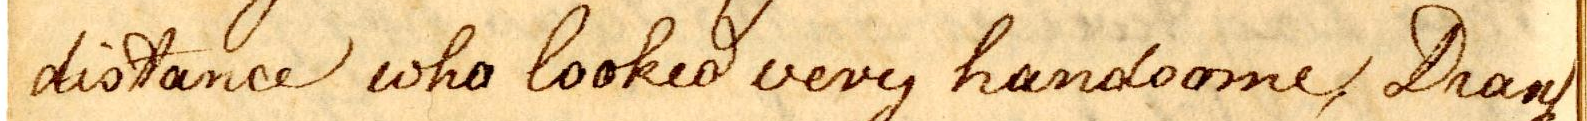distance who looked very handsome, Drank
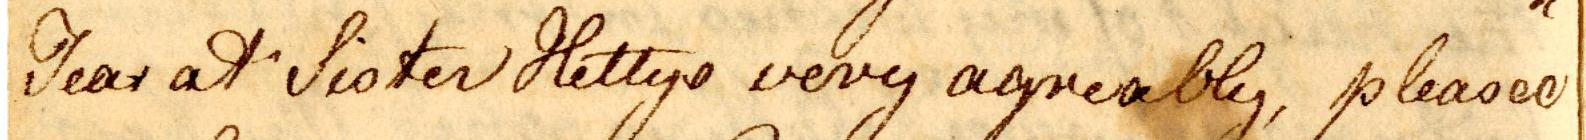Tea at Sister Hettys very agreably, pleased
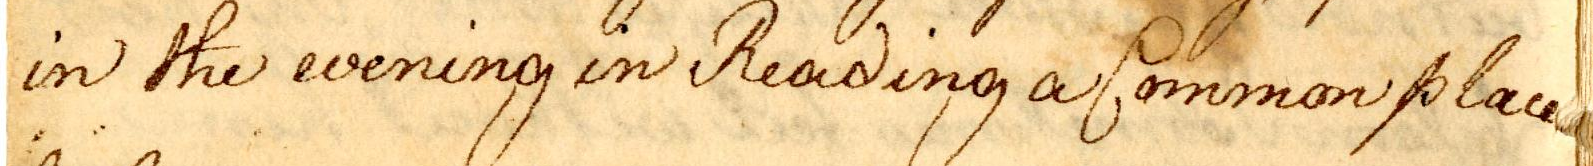in the evening in Reading a Common place
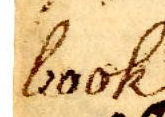book.
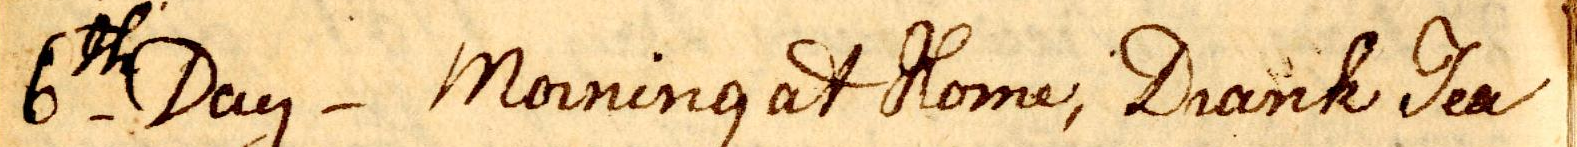6^th Day- Morning at Home, Drank Tea
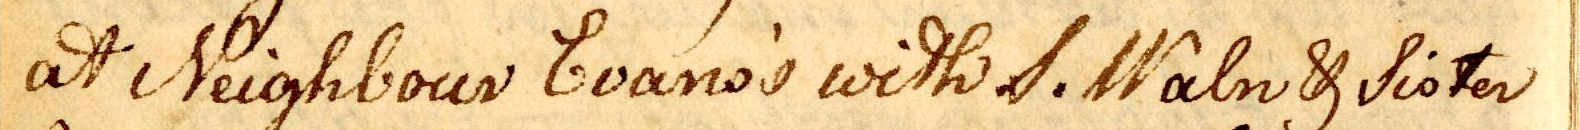at Neighbour Evans's with S. Waln & Sister
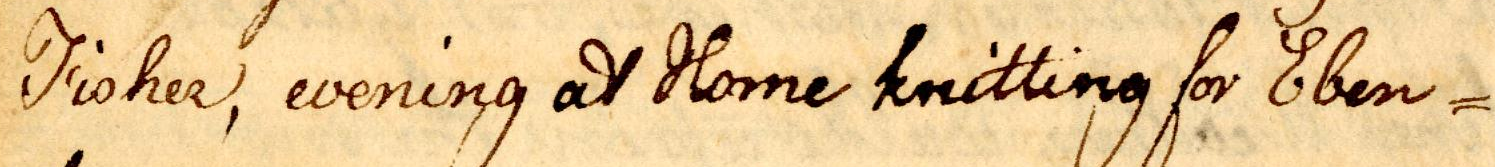Fisher, evening at Home knitting for Eben-
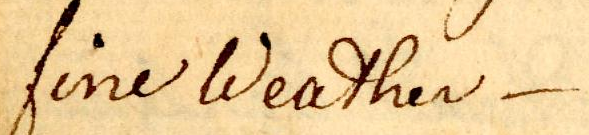fine Weather-
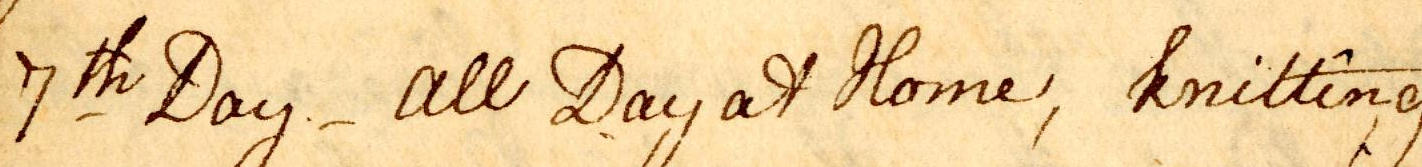7^th Day- all Day at Home, knitting
